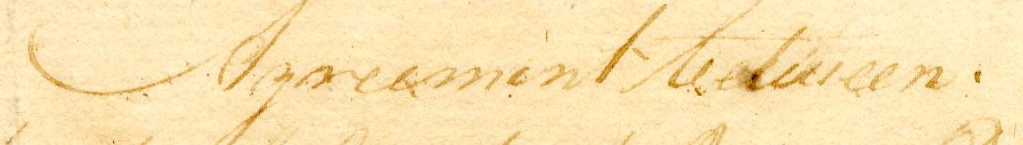Agreement between
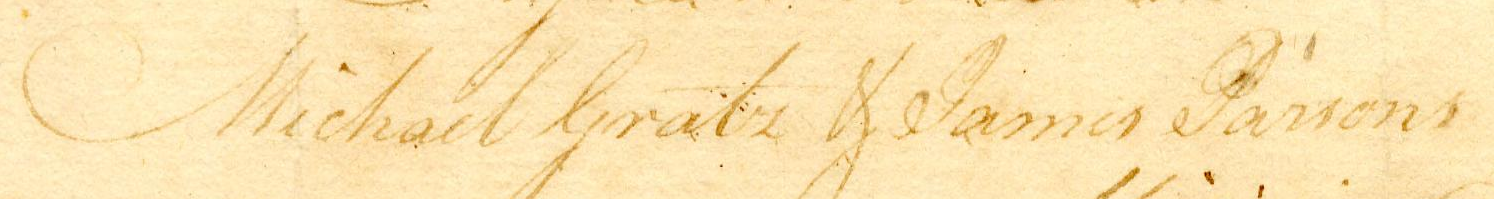Michael Gratz & James Parsons
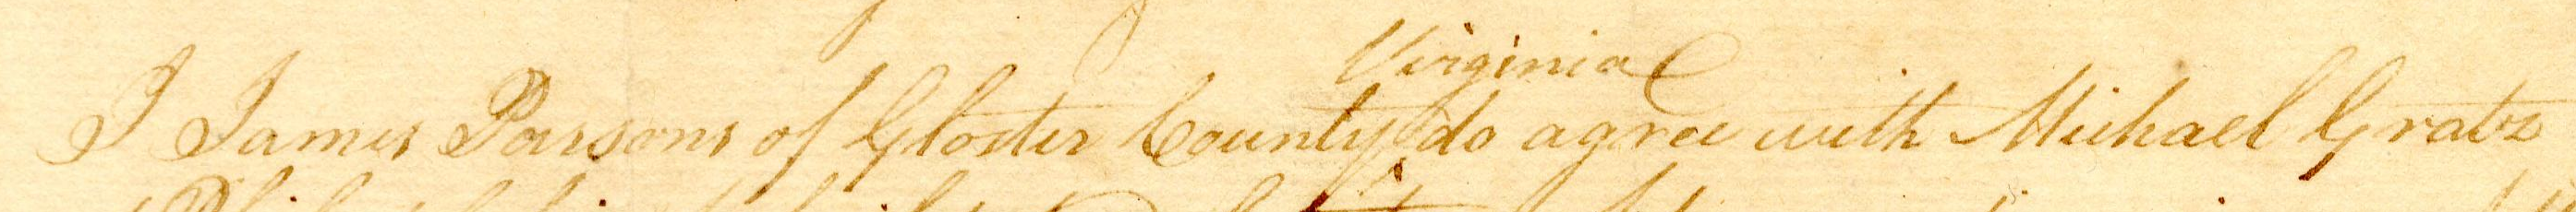I James Parsons of Gloster County ^ do agree with Michael Gratz
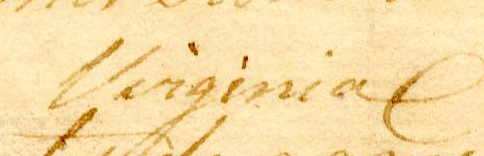Virginia
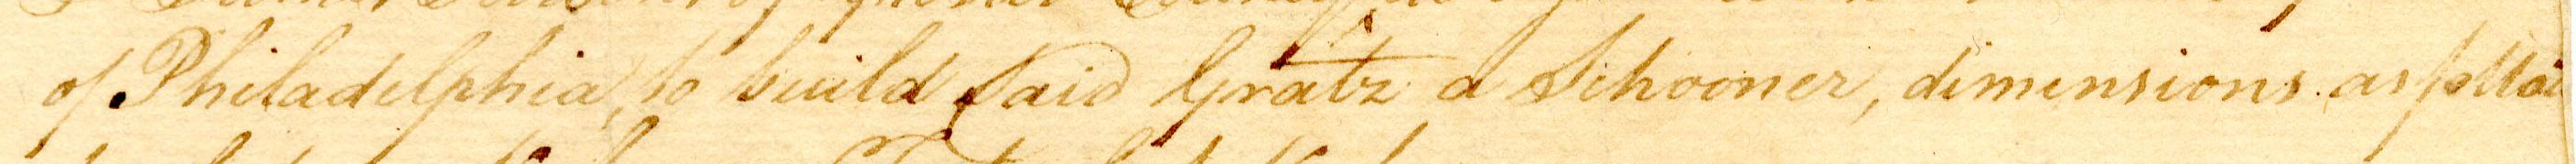of Philadelphia to build said Gratz a Schooner, dimensions as follows
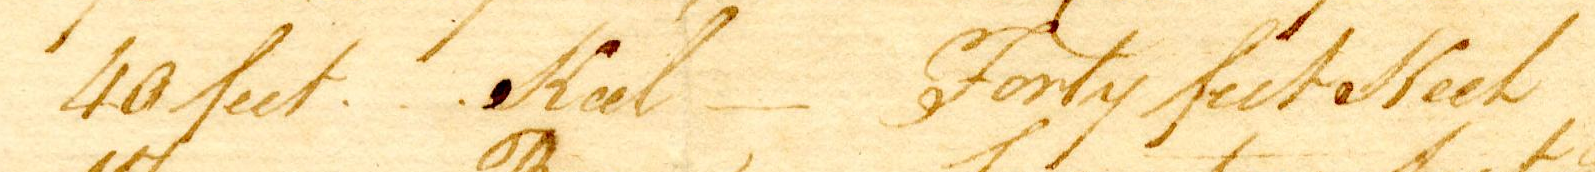40 feet... Keel- Forty feet Keel
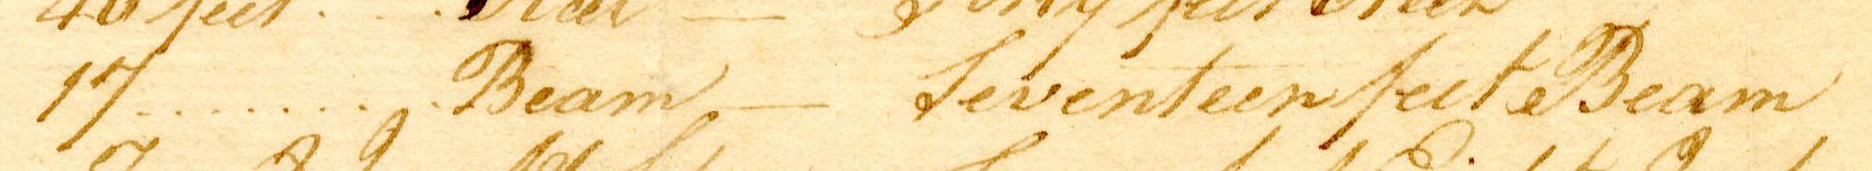17....... Beam- Seventeen feet Beam
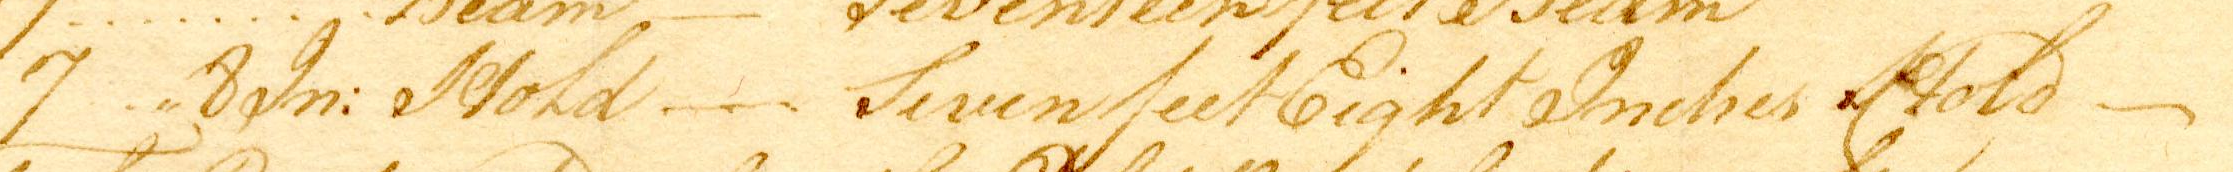7.. 8 In: Hold- Seven feet Eight Inches Hold-
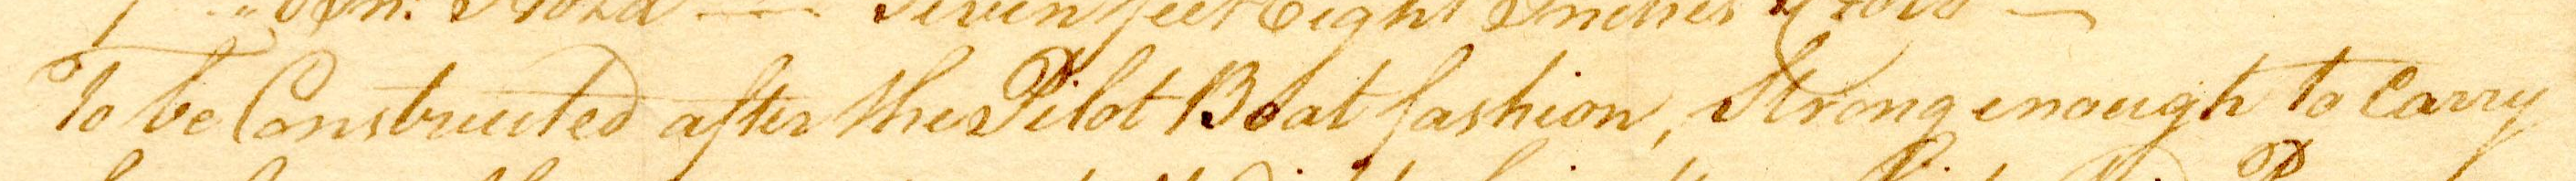To be Constructed after the Pilot Boat fashion, Strong enough to Carry
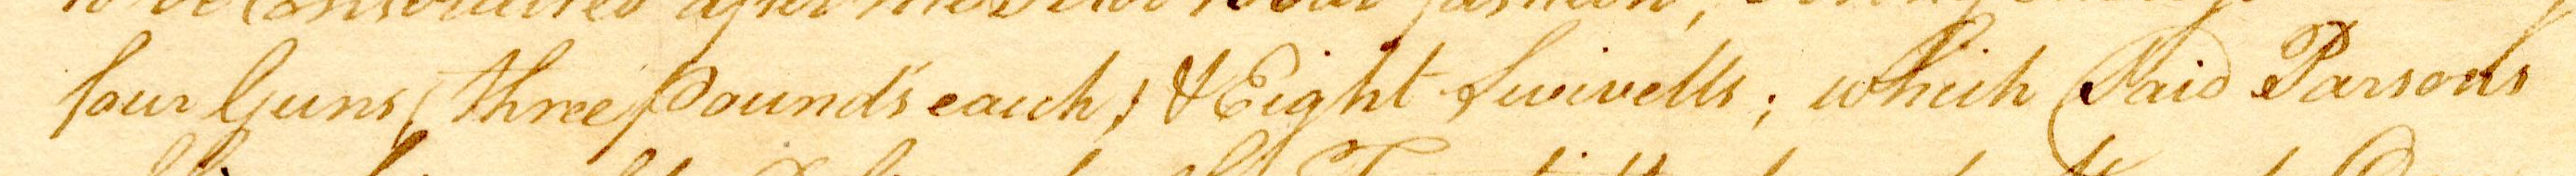four Guns, three pounds each, & Eight Swivells; which said Parsons
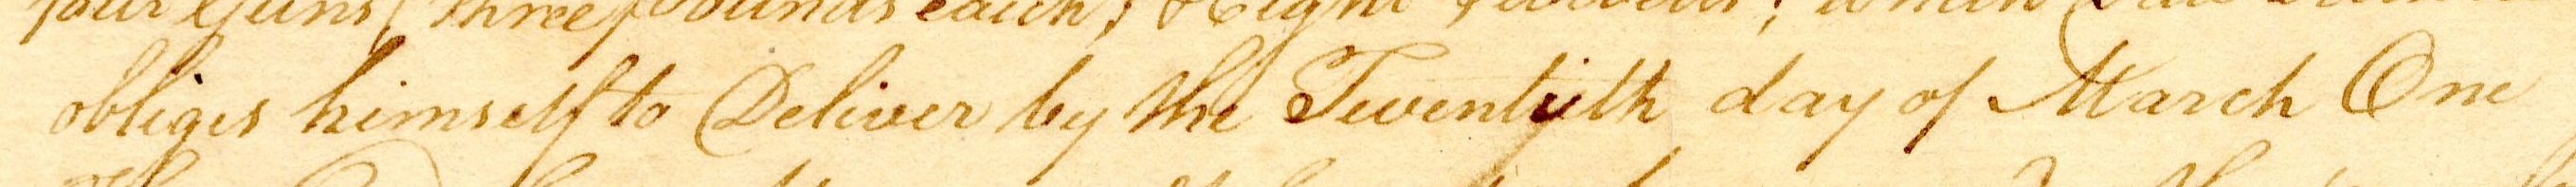obliges himself to Deliver by the Twentieth day of March One
